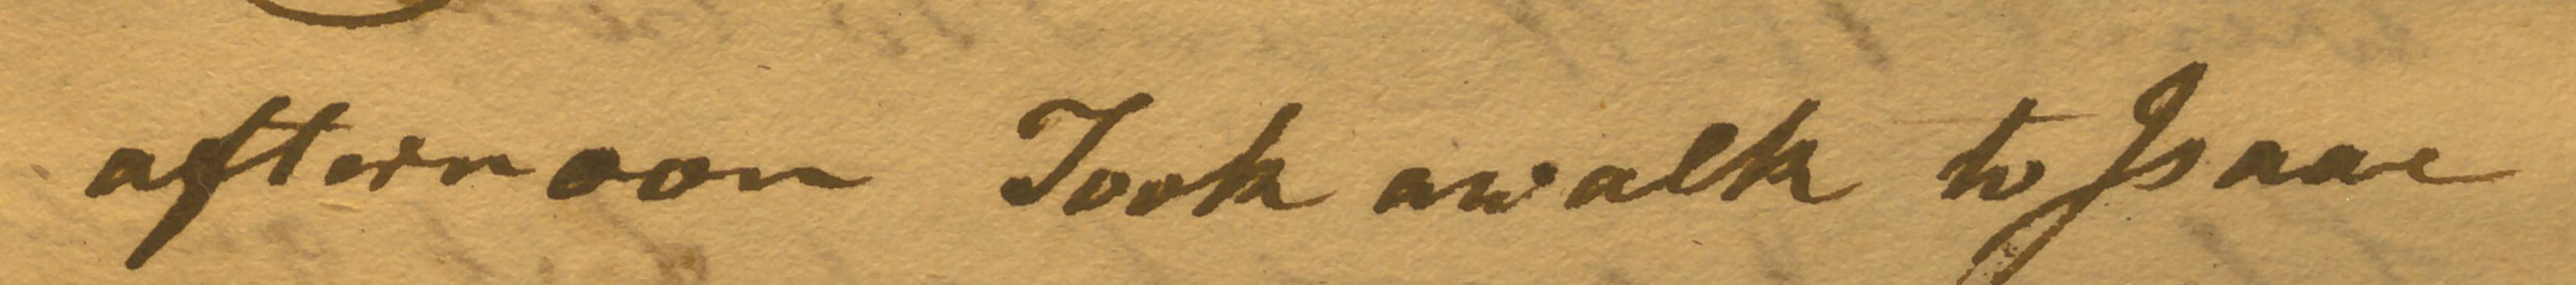afternoon Took a walk to Isaac
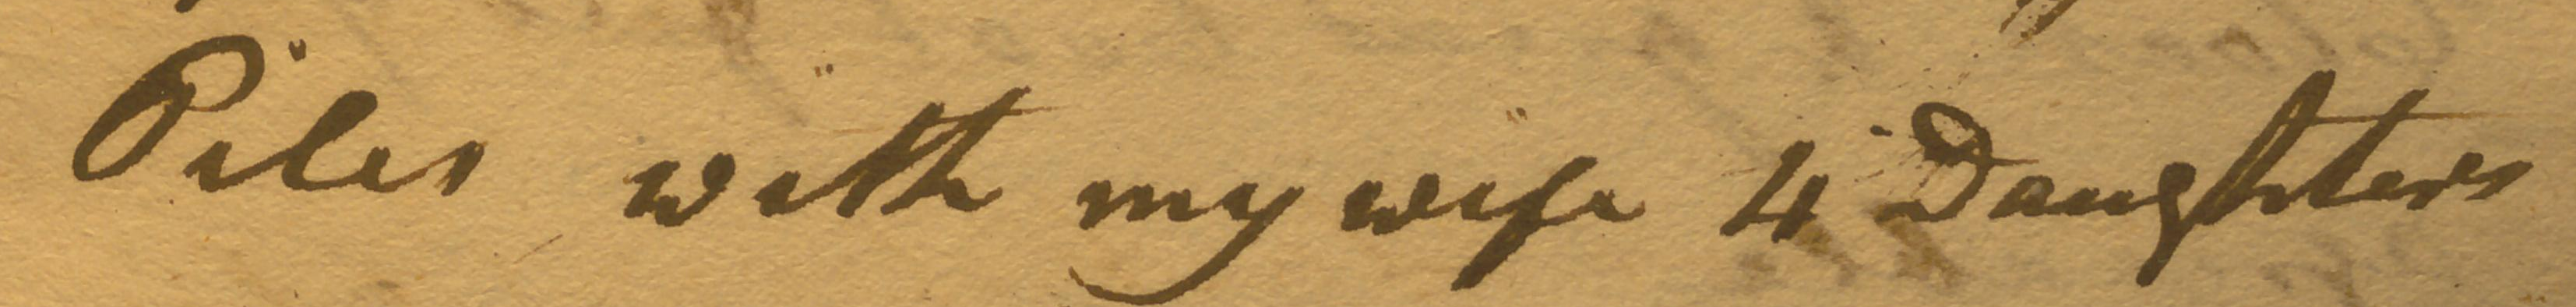Piles with my wife 4 Daughters
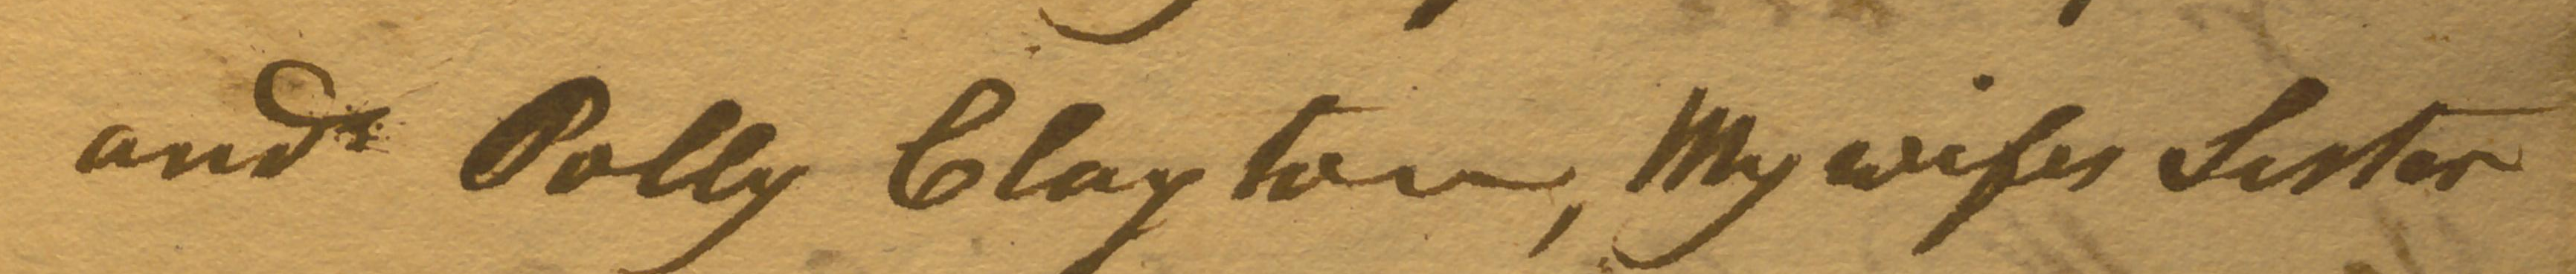and Polly Clayton My wifes Sister
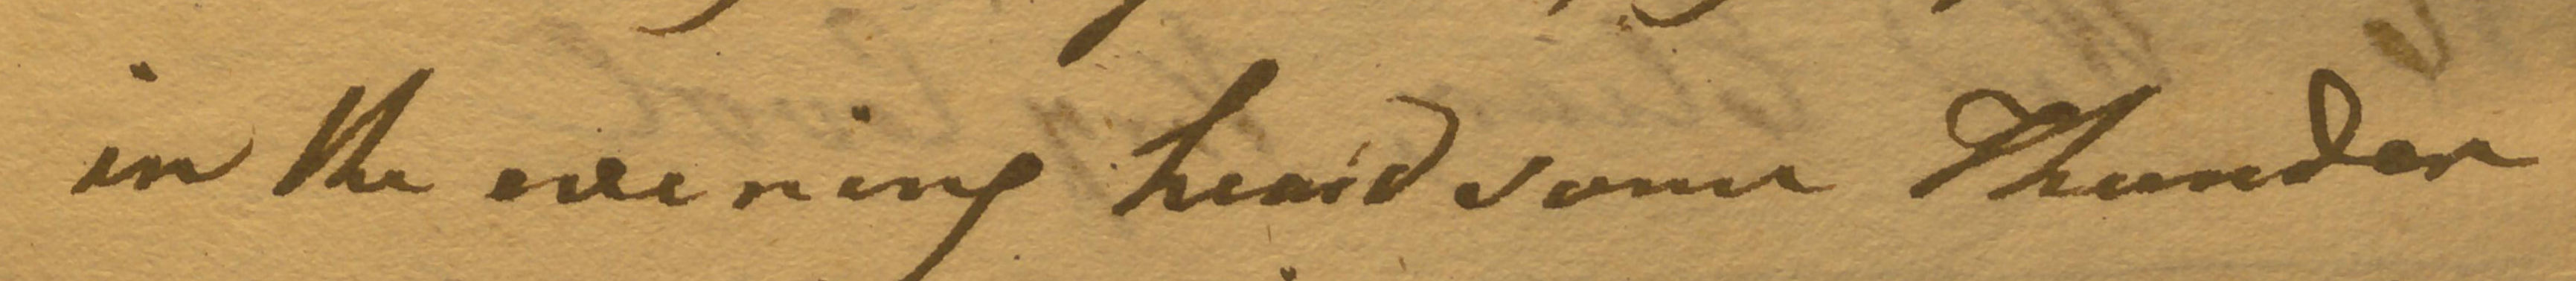in the evening heard some Thunder
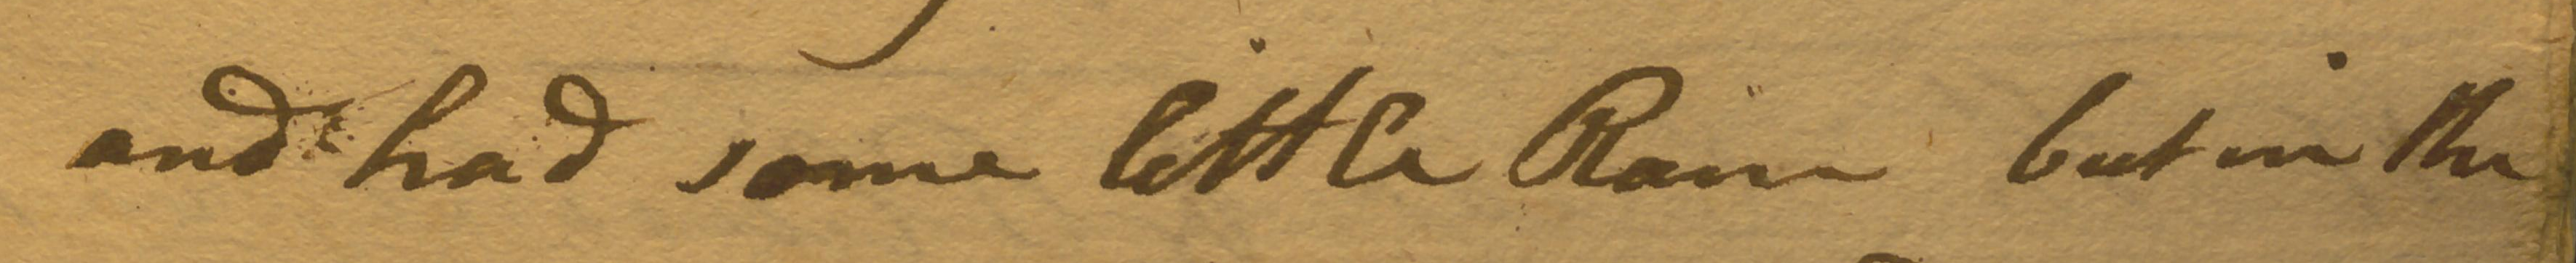and had some little Rain but in the
